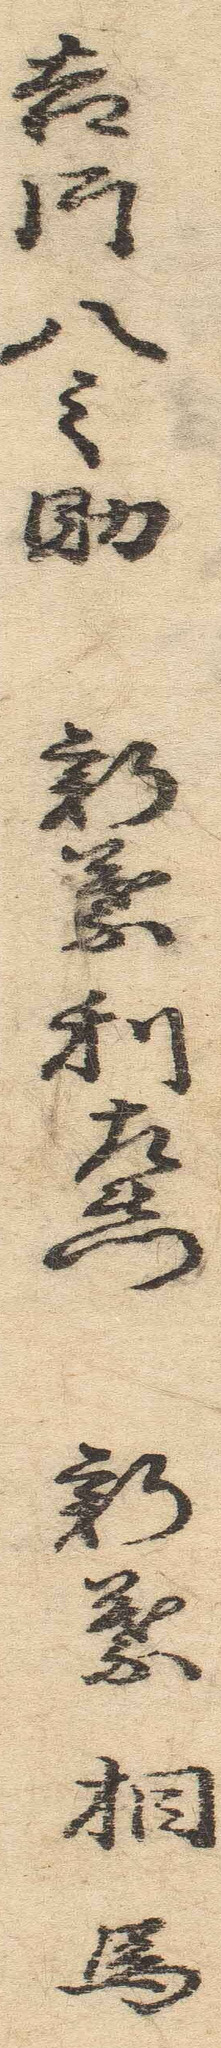吉川八之助新葉利左衛門新葉相馬
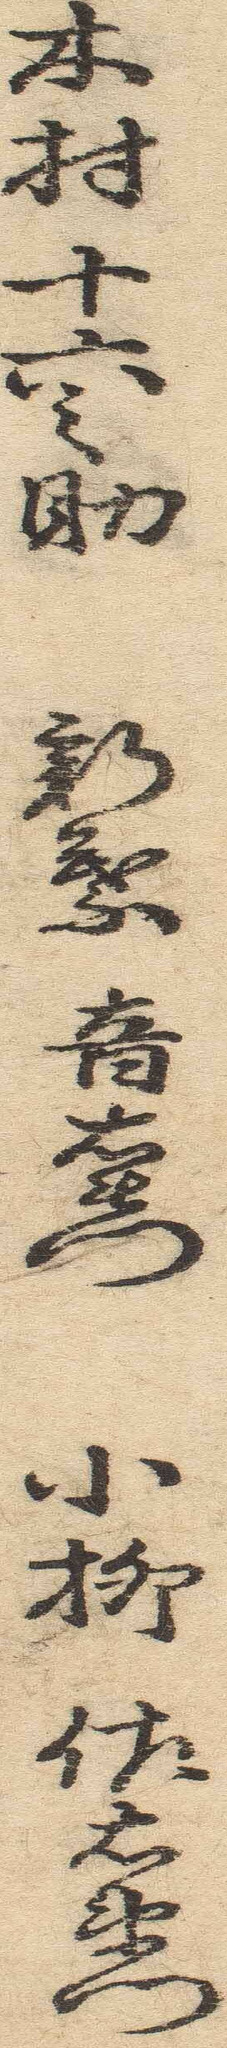木村十六之助新葉音右衛門小柳佐右衛門
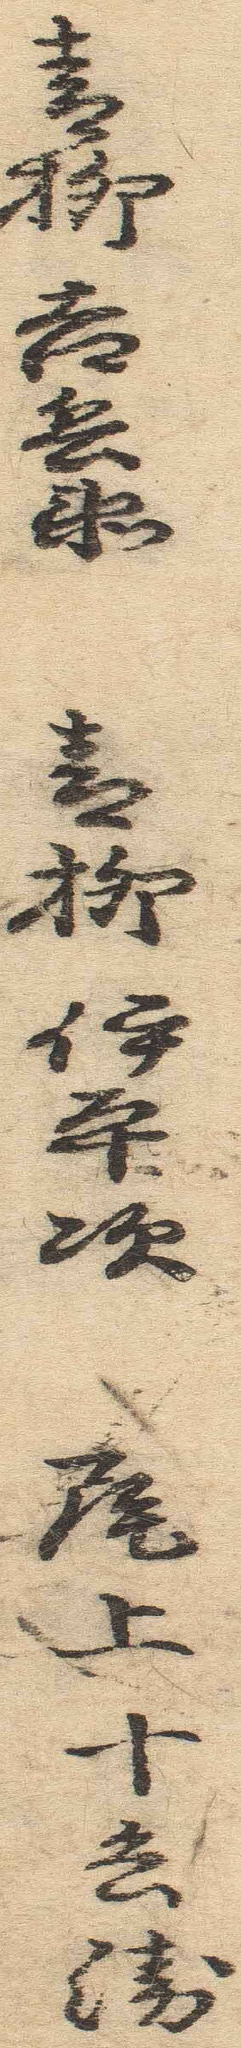青柳吉兵衛青柳伊平次尾上十兵衛
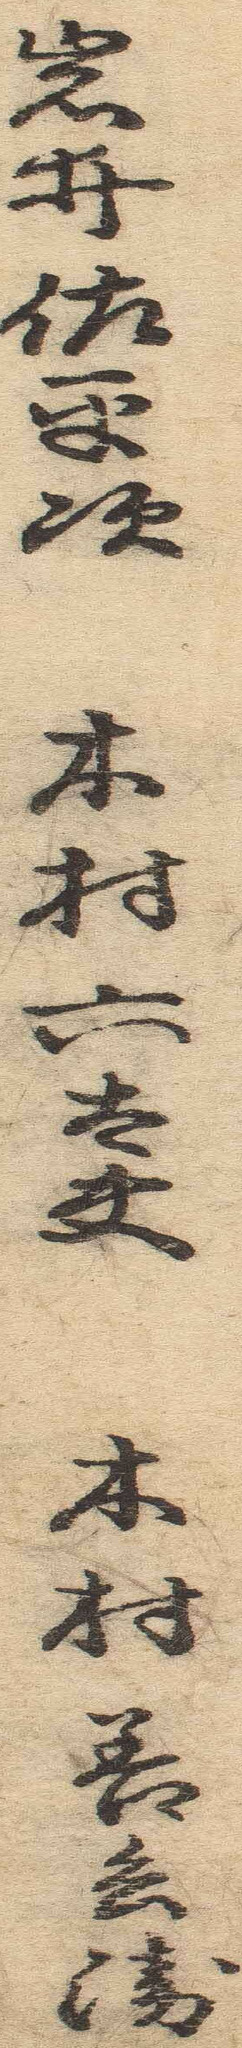岩井佐平次木村六太夫木村善兵衛
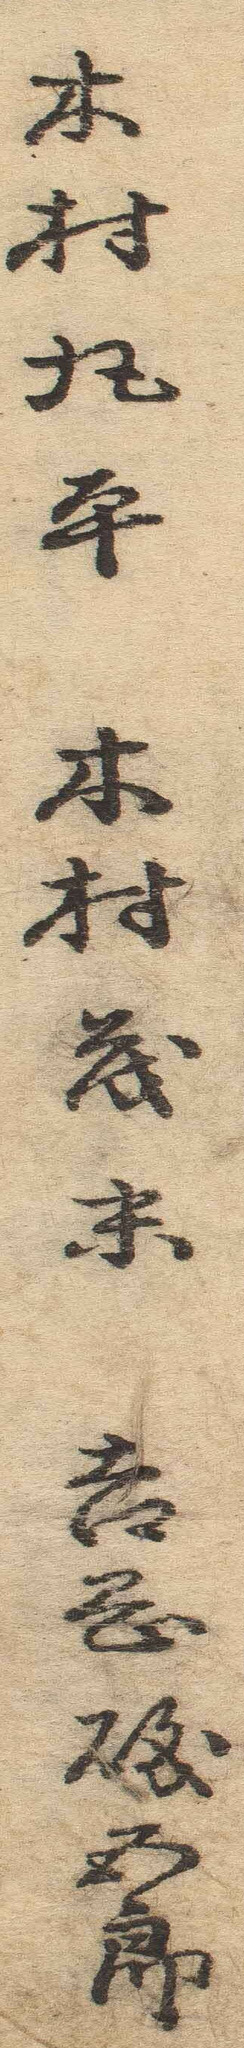木村丸平木村茂末吉岡磯五郎
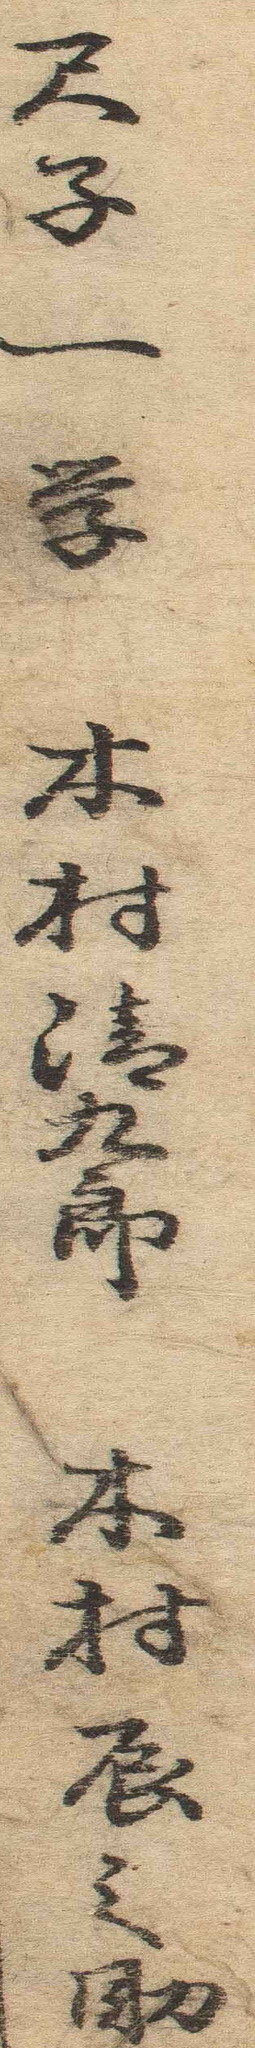尺子一学木村清九郎木村辰之助

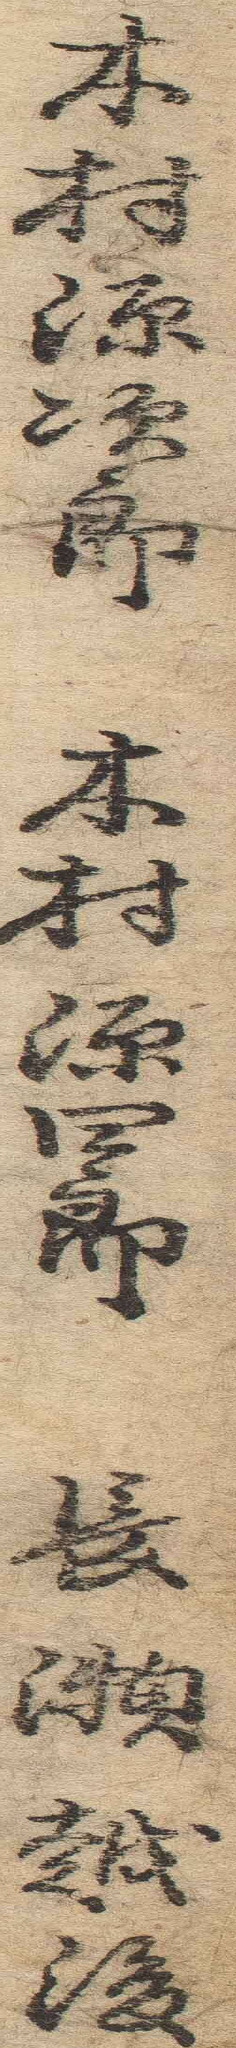木村源次郎木村源四郎長瀬越後
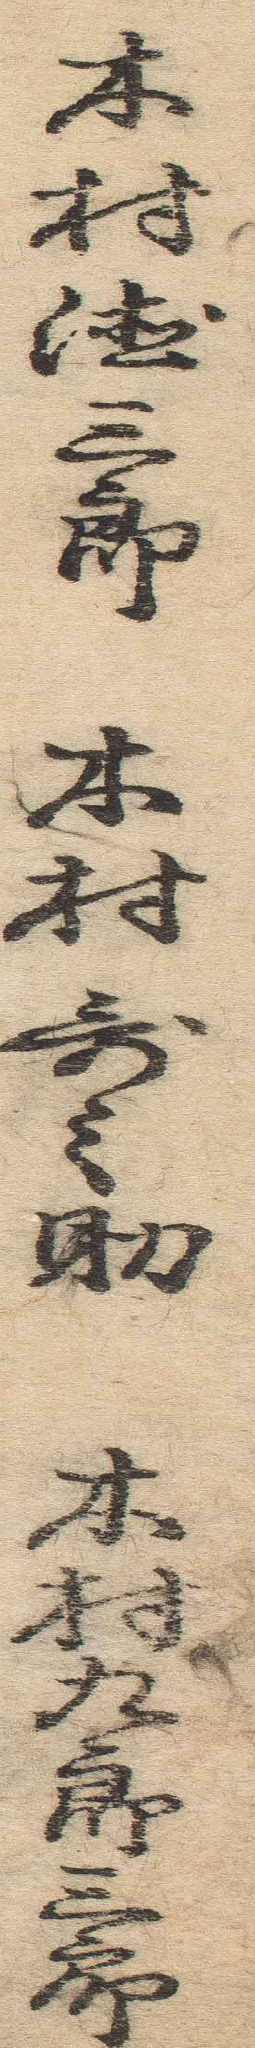木村徳三郎木村奇之助木村九郎三郎
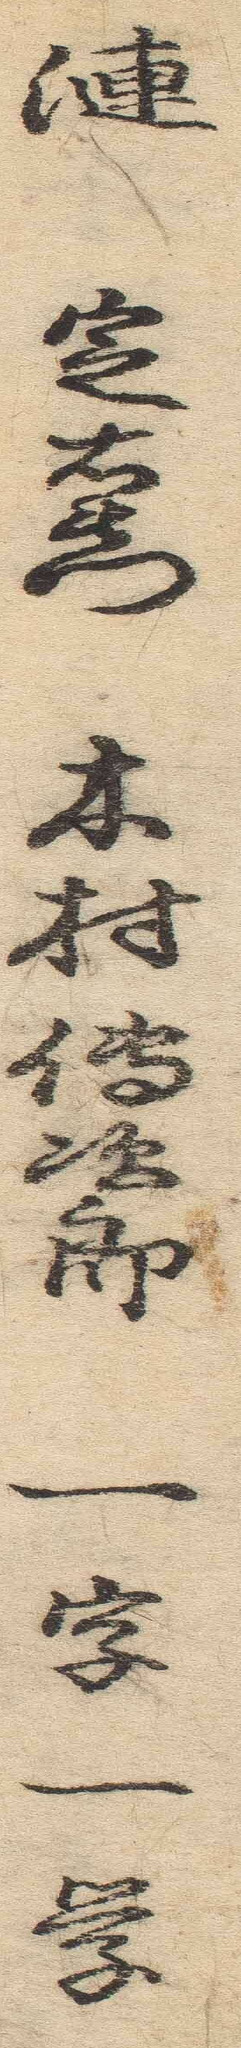漣定右衛門木村伝次郎一字一学
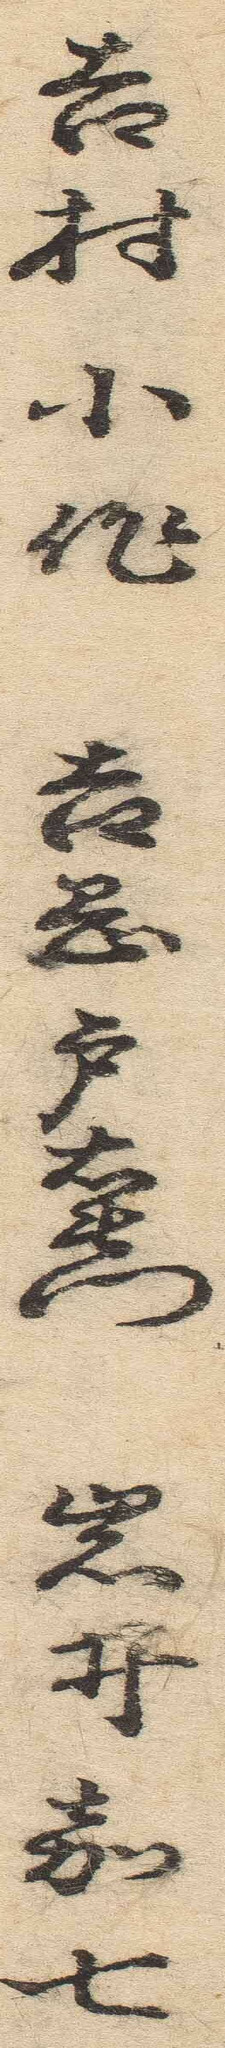吉村小作吉岡戸右衛門岩井嘉七
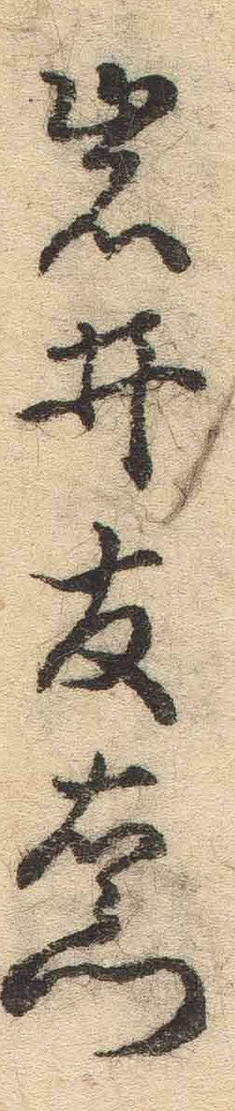岩井友右衛門
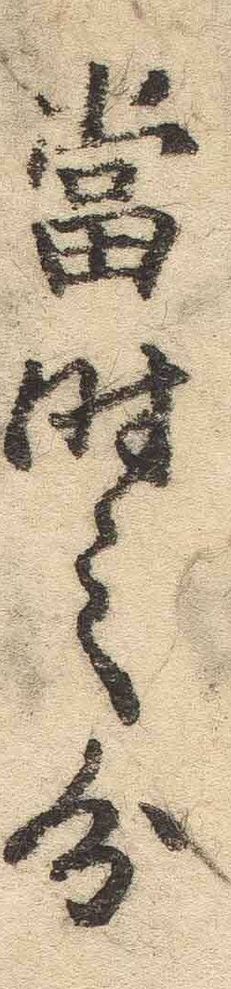当時之分
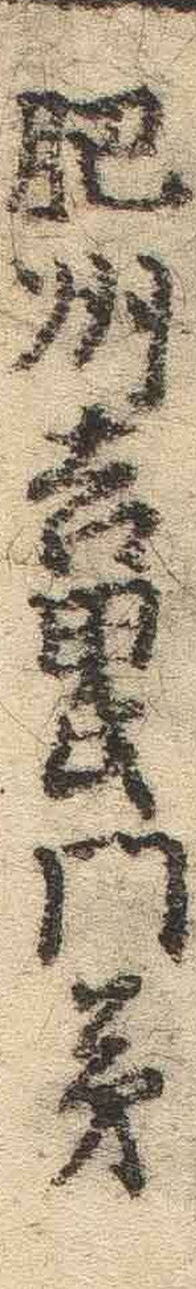肥州吉田氏門弟
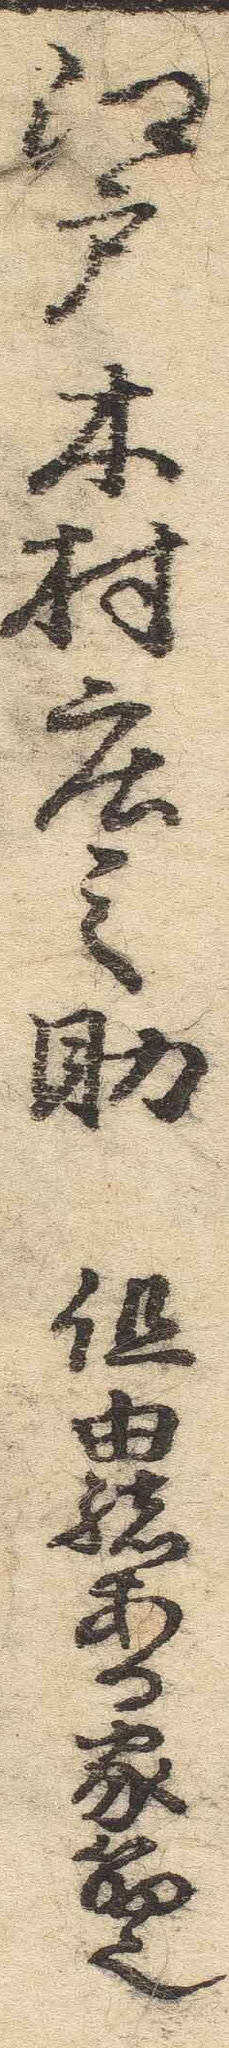江戸木村庄之助但由緒ある家筋也
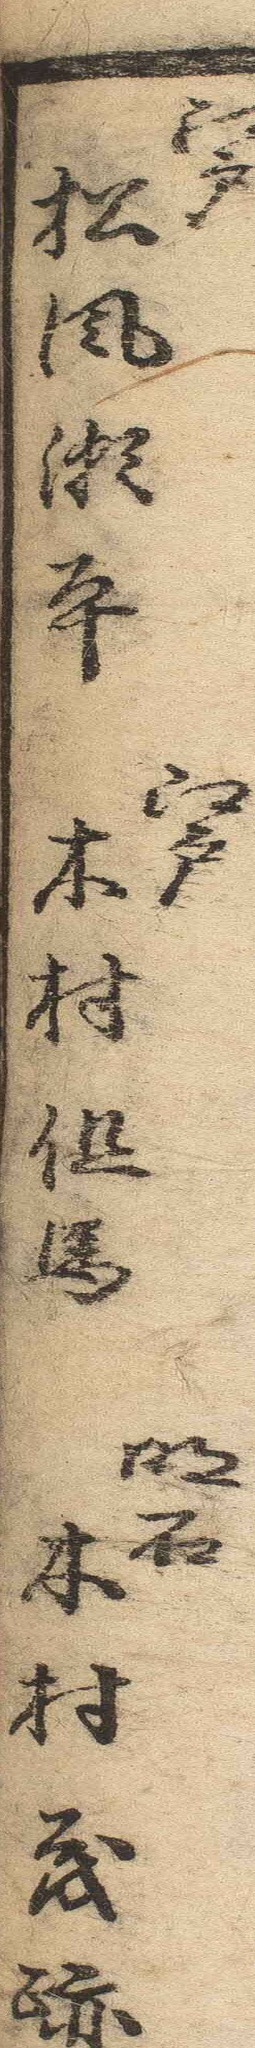松風瀬平木村但馬木村茂跡
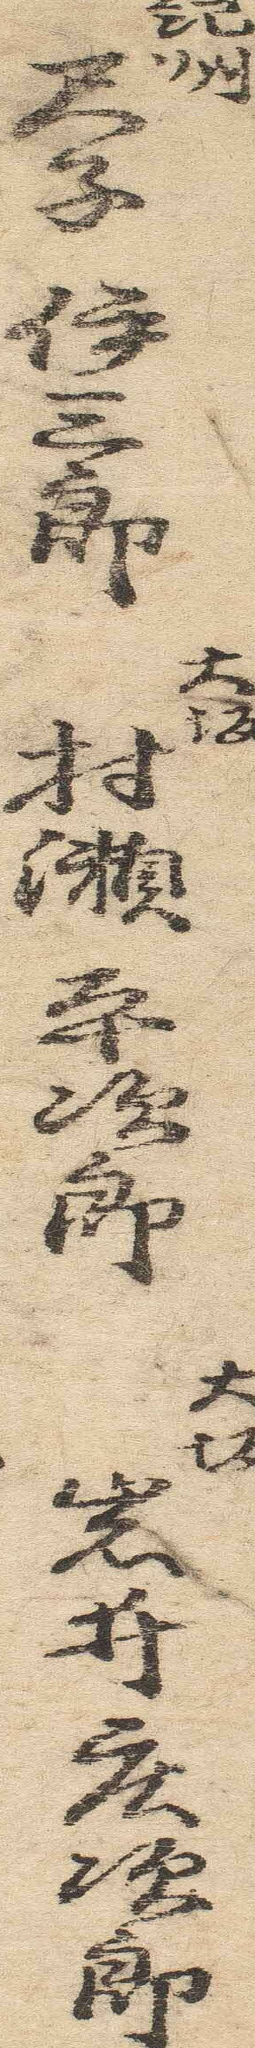尺子伊三郎村瀬平次郎岩井庄次郎
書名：古今相撲大全
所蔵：東京学芸大学附属図書館 国文学研究資料館
